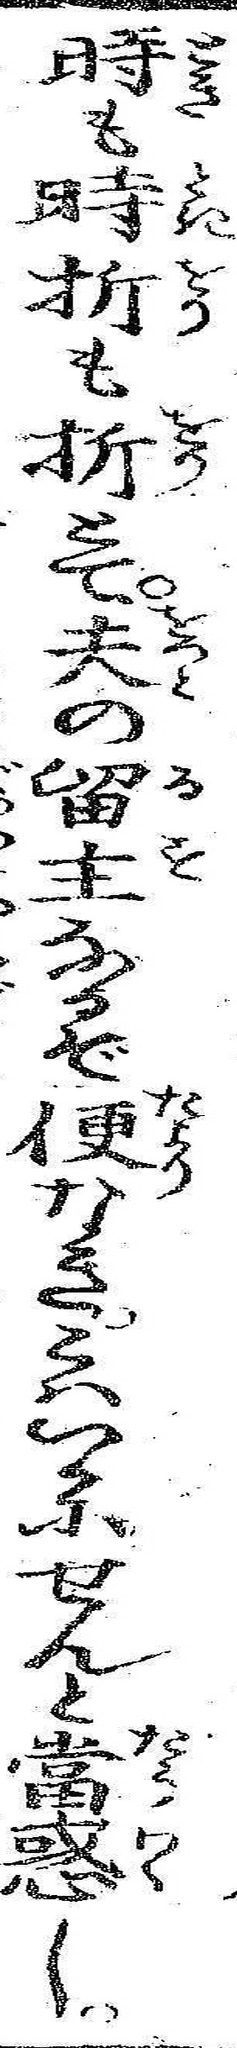時も時折も折とて。夫の留主なるぞ便なき。こはいかにせんと当惑し。
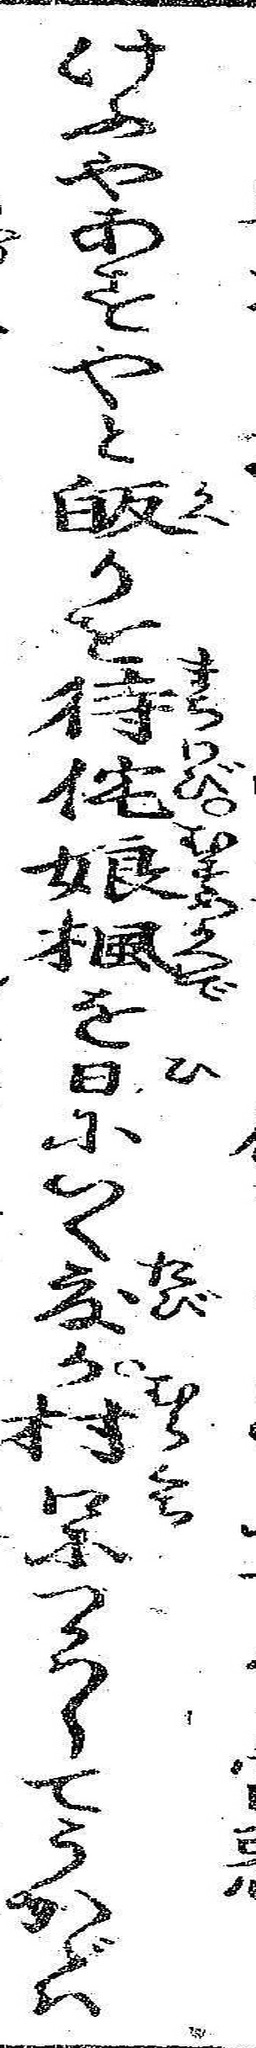けふやあすやと帰りを待侘。娘楓を日にいく度か。村口につかはしてうかゞは
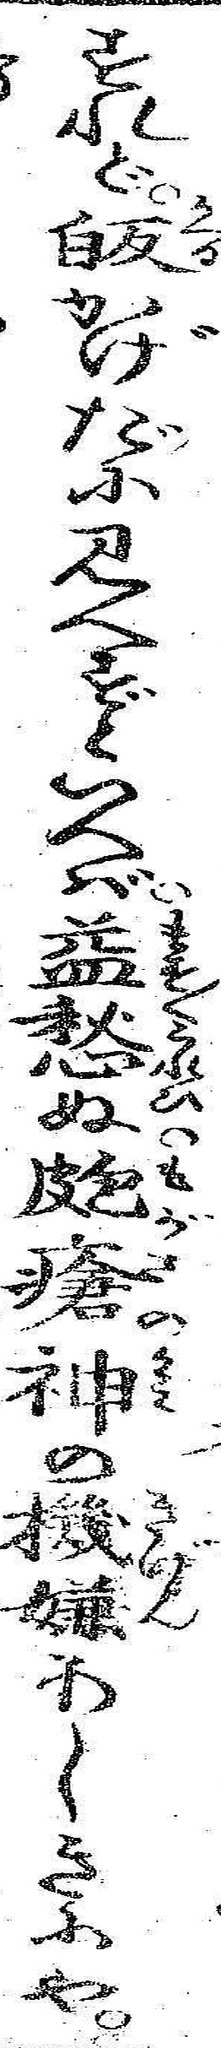すれど。帰かげだに見へずといへば。益愁ぬ。皰瘡神の機嫌あしきにや。
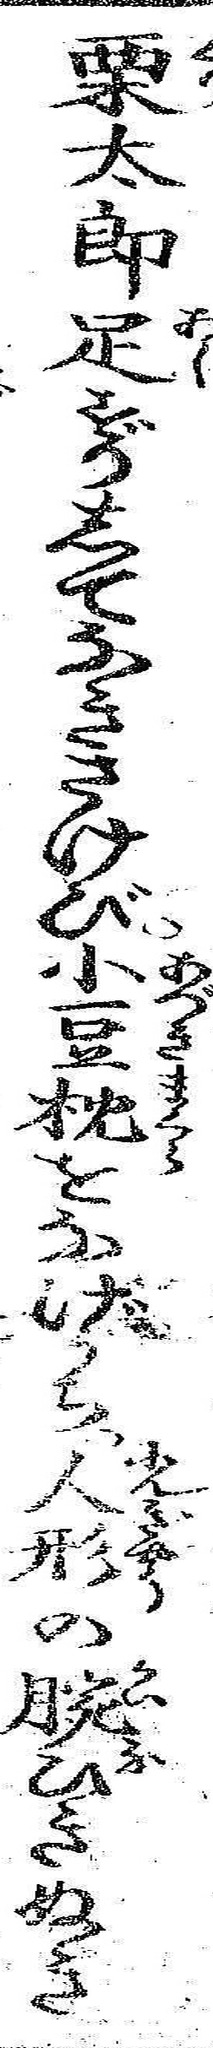栗太郎足ずりしてなきさけび。小豆枕をなげうち。人形の腕ひきぬき
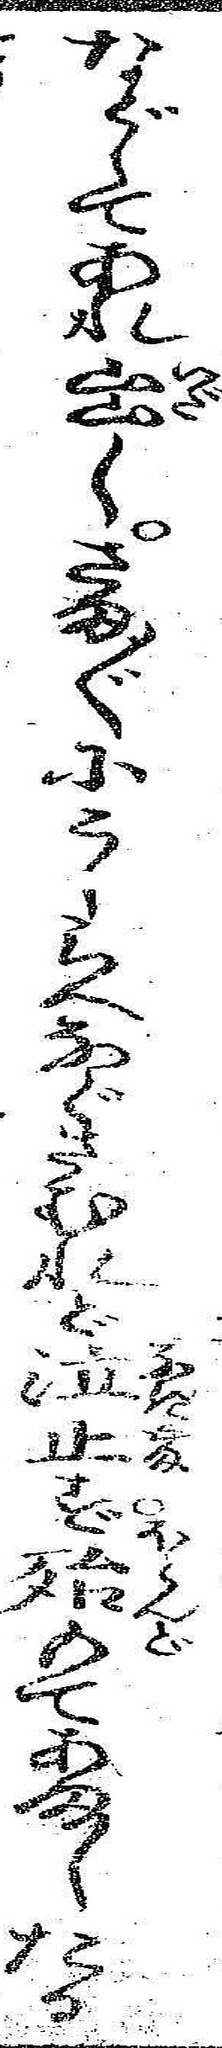などしてあれ出し。さま〴〵にこしらへなぐさむれど泣止ず。殆もてあましたる
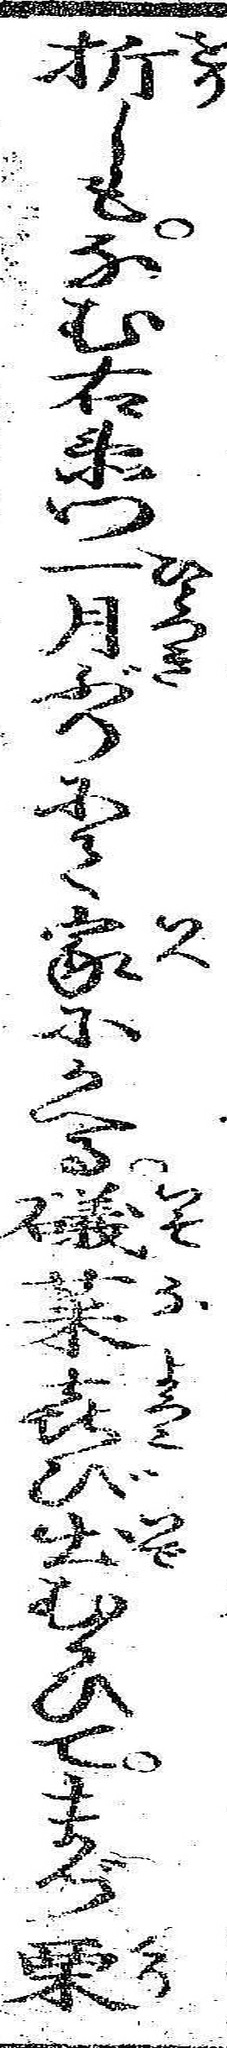折しも。なむ右衛門一月ぶりにて家にかへる。磯莱喜び出むかひて。まづ栗
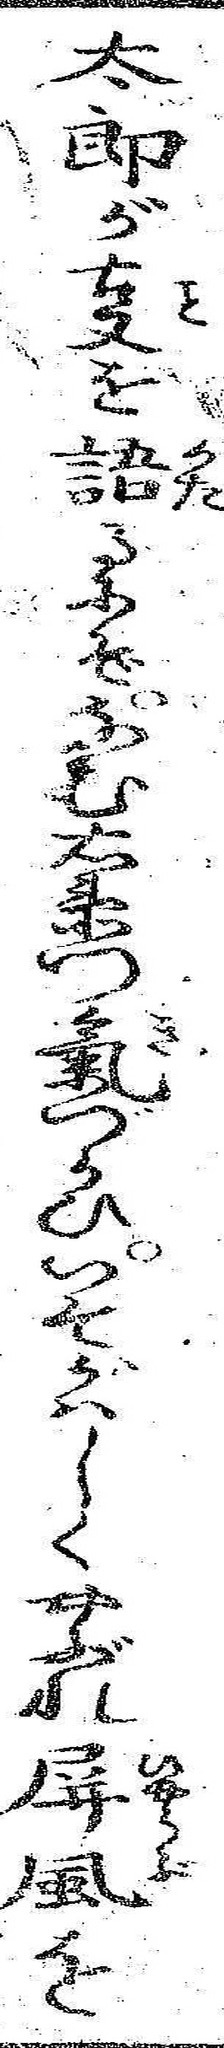太郎が事を語るにぞ。なむ右衛門気づかひ。いそがはしくやぶれ屏風を

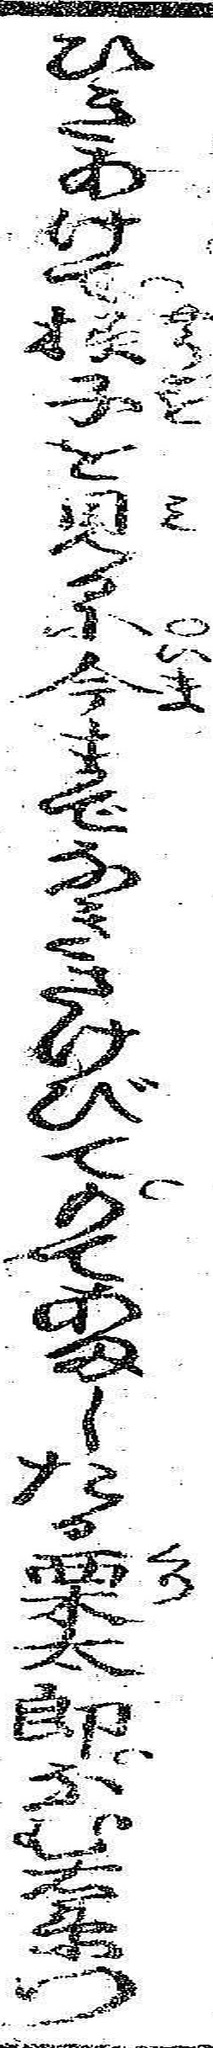ひきあけて。様子を見るに。今までなきさけびて。もてあましたる栗太郎。なむ右衛門
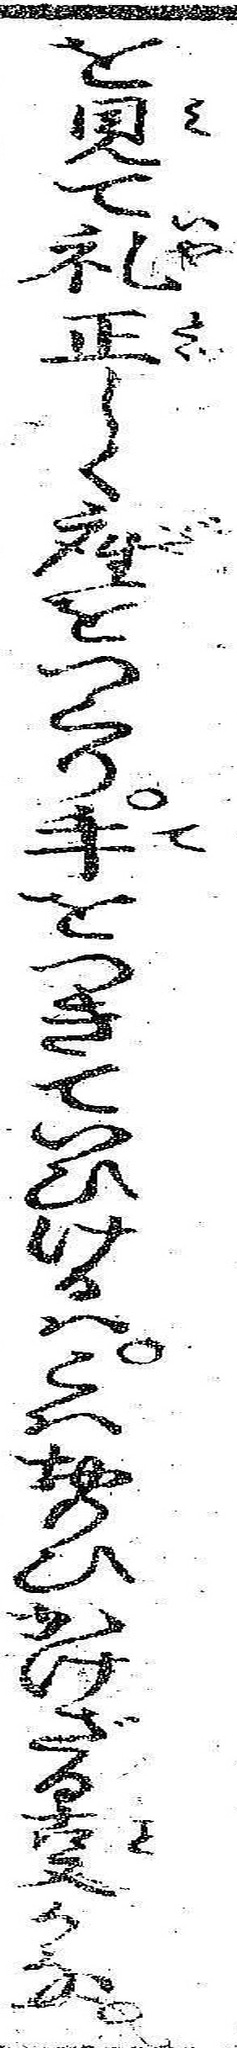を見て礼正しく座をつくり。手をつきていひけるは。こはおもひかけざる事かな。
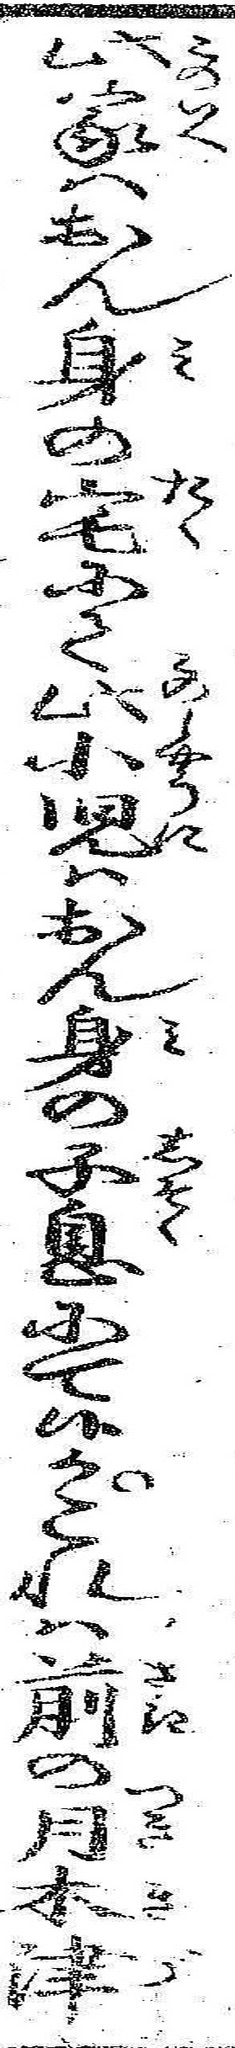此家はおん身の宅にて此小児はおん身の子息にて候か。これは前の月木津
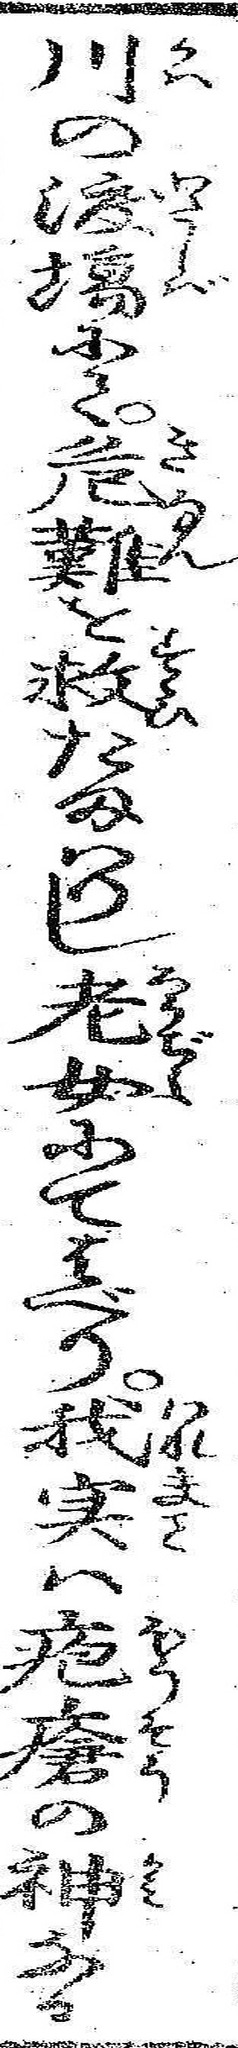川の渡場にて。危難を救たまはりし老女にてはべり。我実は疱瘡の神なる
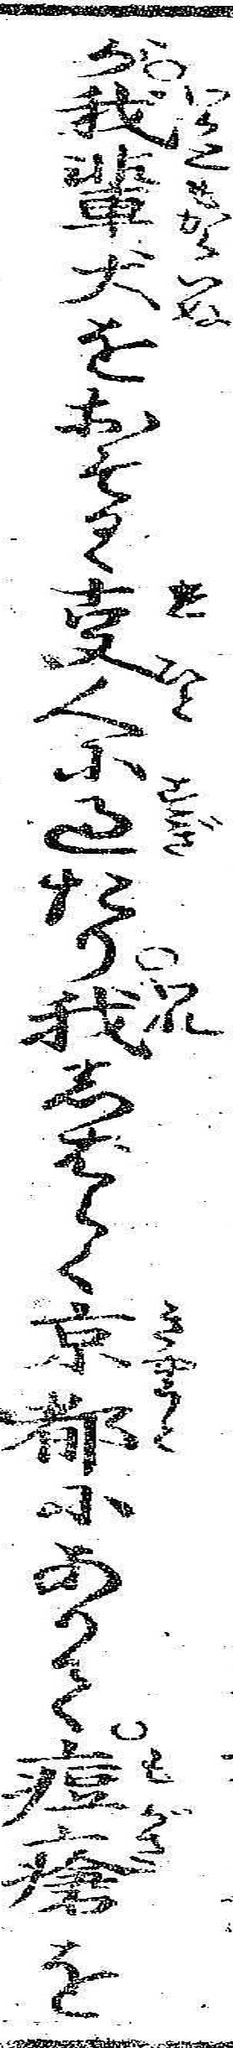が。我輩犬をおそるゝ事人に過たり。我しばらく京都にありて。痘瘡を
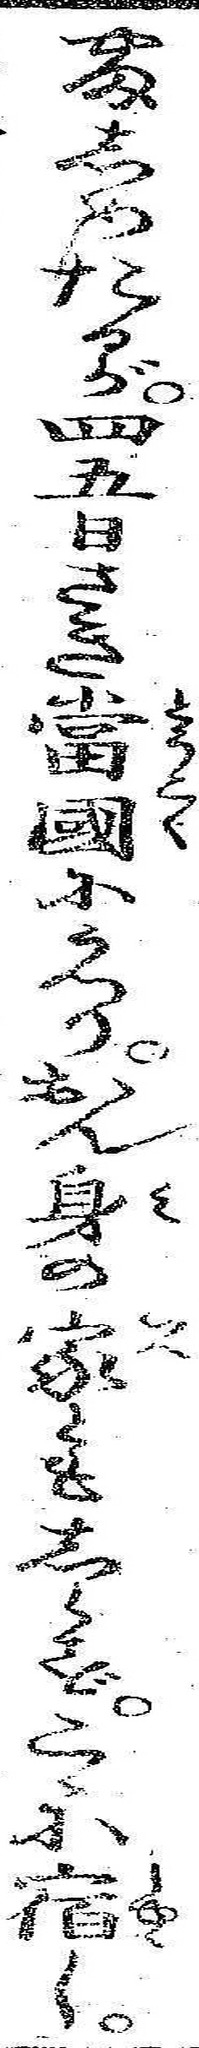やましめたるが。四五日さき当国にうつり。おん身の家ともしらず。こゝに宿し。
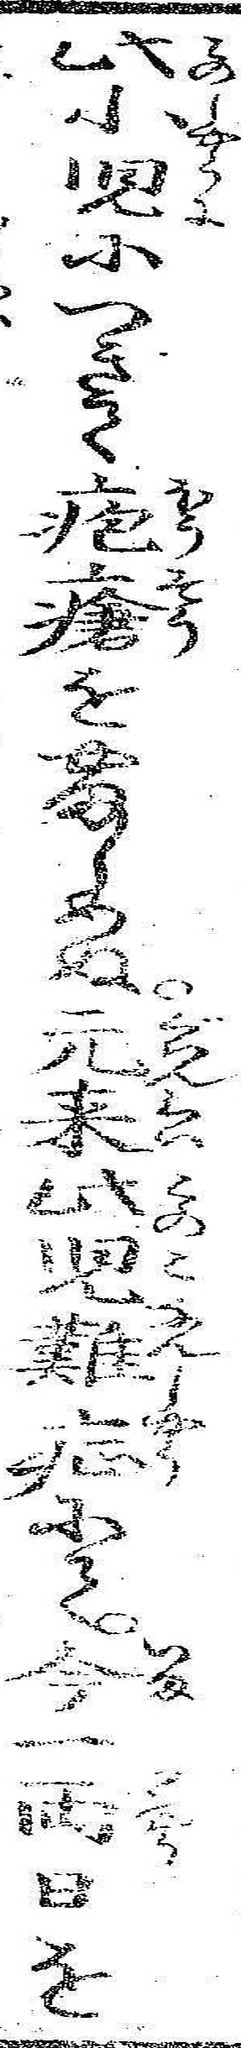此小児につきて疱瘡をやましめぬ。元来此児難症にて。今一両日を
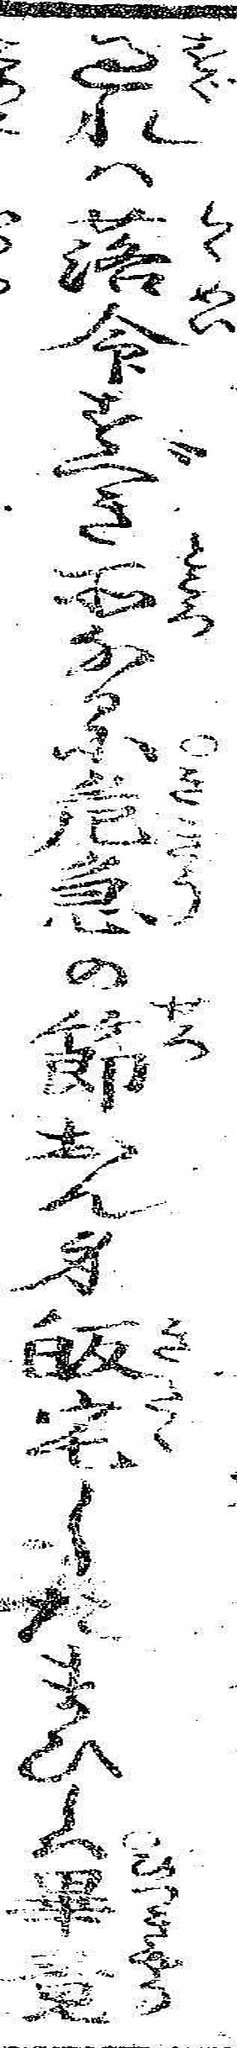過れは落命すべき所なるに。危急の節おん身帰宅したまひしは。畢竟
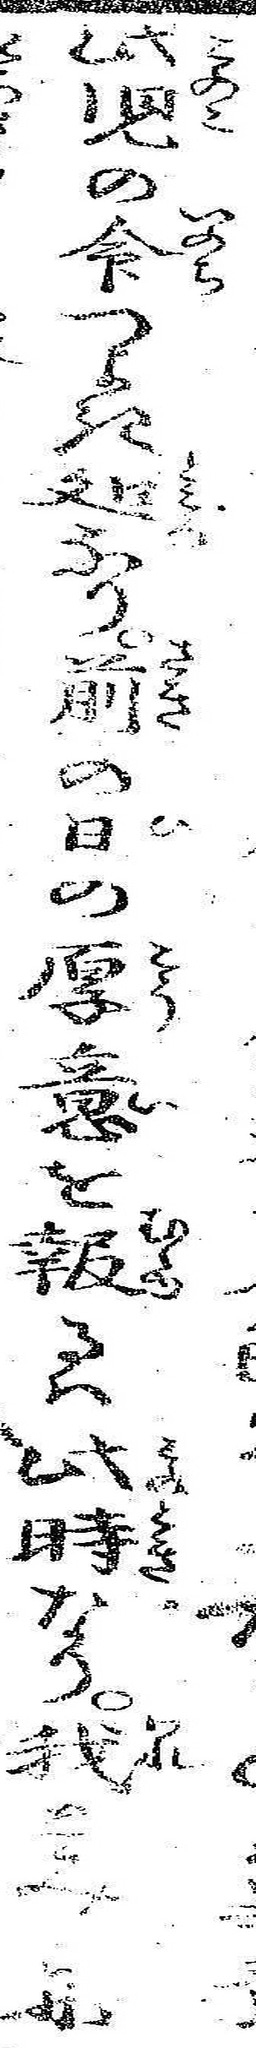此児の命つよき処なり。前の日の厚意を報るは此時なり。我とみに
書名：昔話稲妻表紙
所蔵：国文学研究資料館
